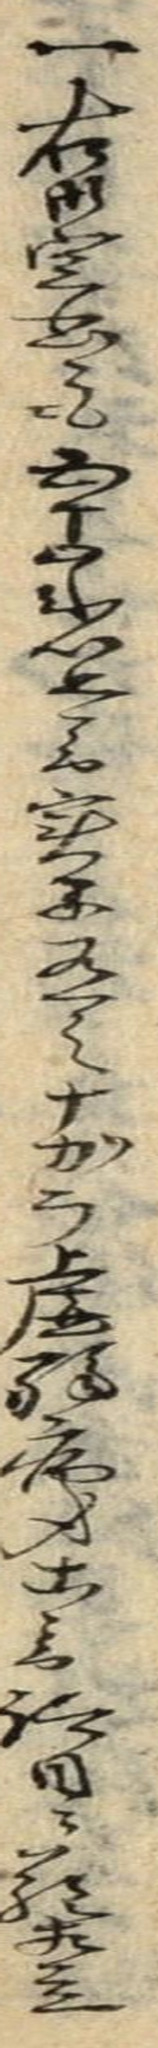一御定書ニも五十歳以上ニ而実子有之ナガラ虚弱病身等ニ而跡目ニ難相立
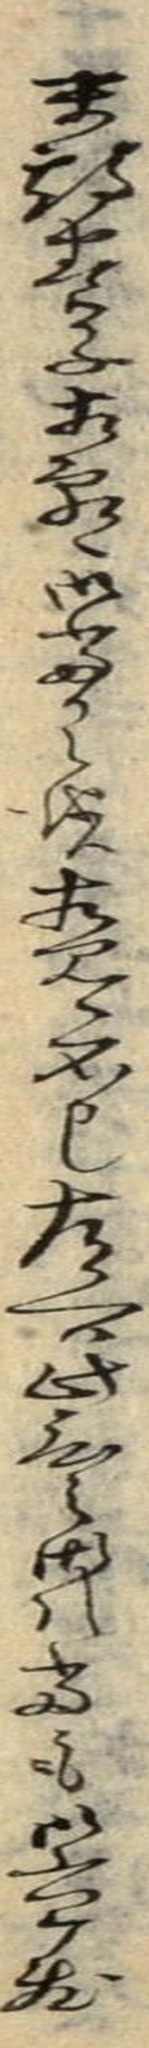末期養子相願ヘ御当リ候儀ハ相見ヘ不申候左候へハ此度之御引当ニも御六ケ敷
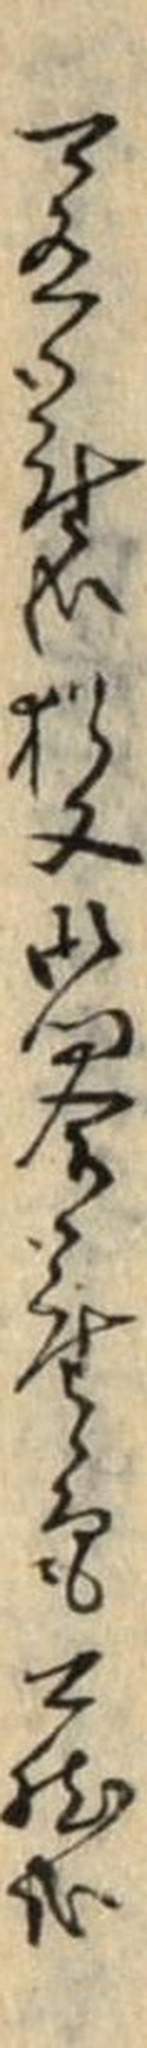可有御座哉猶又御問合御座候而も可然哉

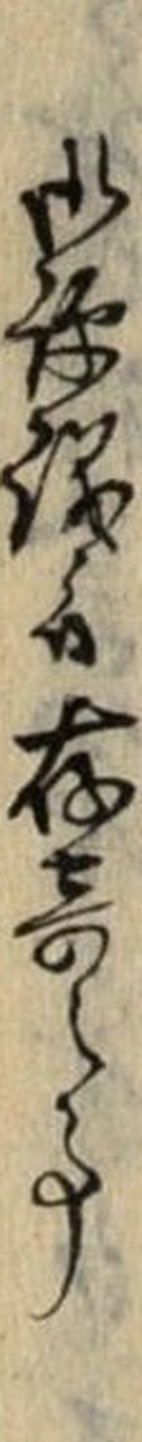御評議ニ付存寄之事
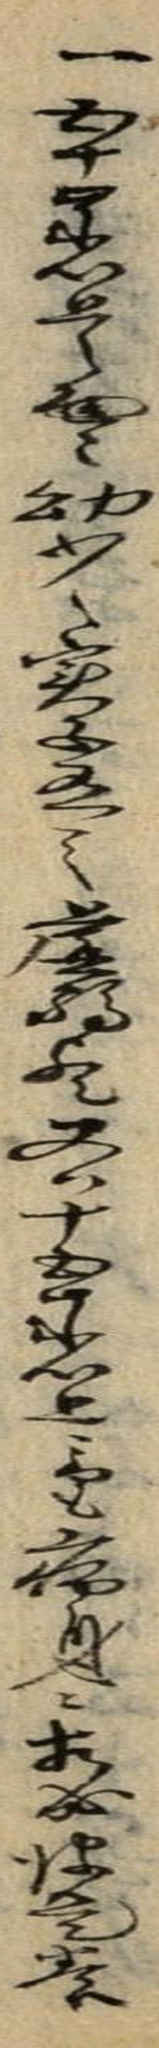一五十歳以上之面々幼少之実子有之虚弱歟又ハ十五歳以上ニ而も病身ニ相成彼是養
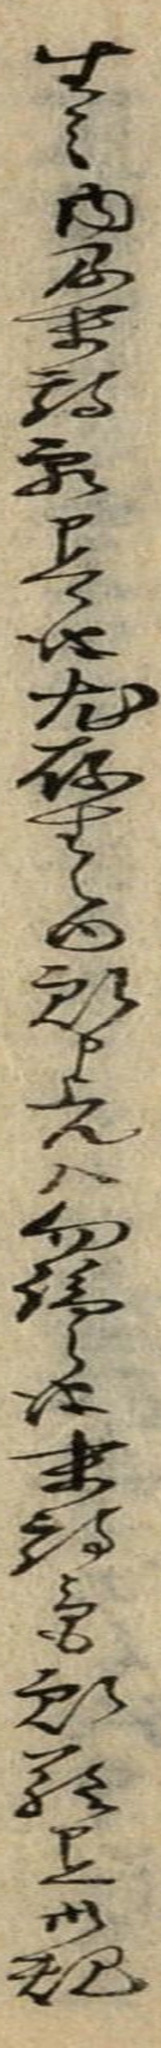生之内及末期願申上候儀尤存生之内願申上ルハ勿論之儀末期ニ而も願難申上御規
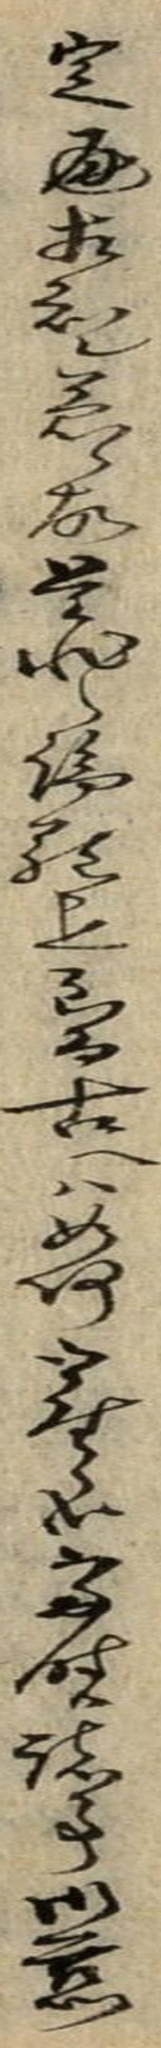定通相知レ兼候故是非之論難申上至而古ヘハ如何御座候哉当時ハ諸事御慈
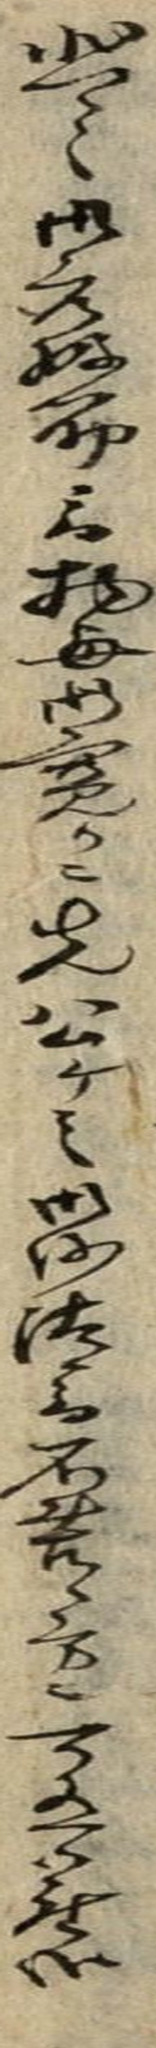悲之御取扱筋ニ而物毎御寛カニ先公ケ之御沙汰ニ而不苦候方ニ可有御座候哉
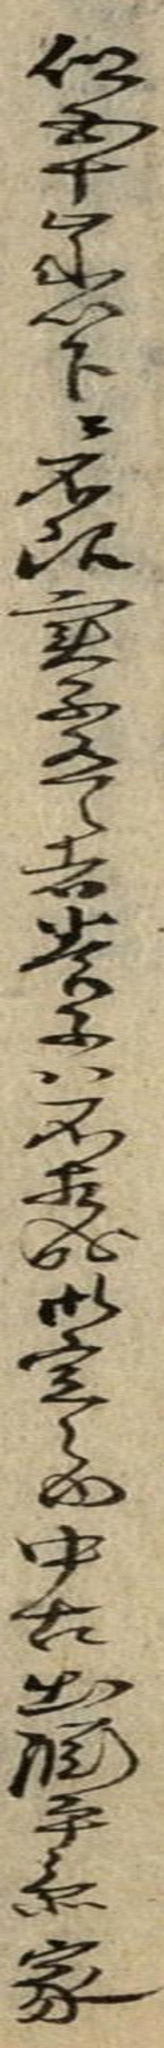但五十歳以下ニ不限実子有之者養子ハ不相成御定之内中古出渕平兵衛家
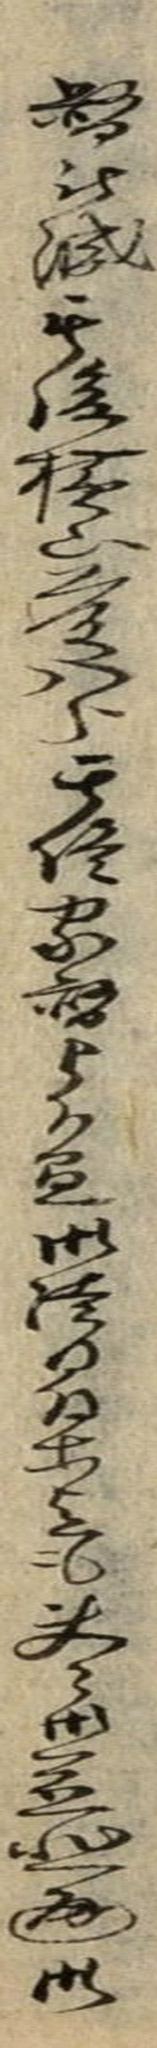督被減其後横山藤八郎其儘家督被下置御徒目付等迄も夫々御慈悲通御
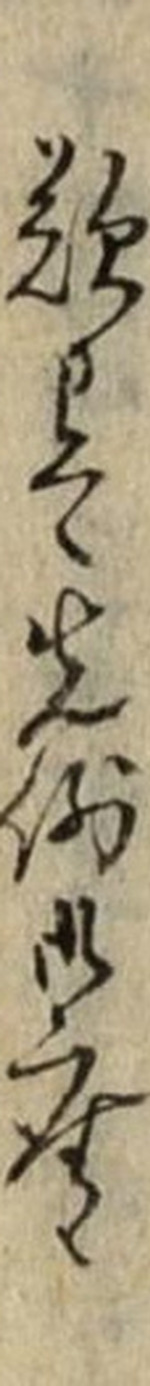歎申上候先例御座候
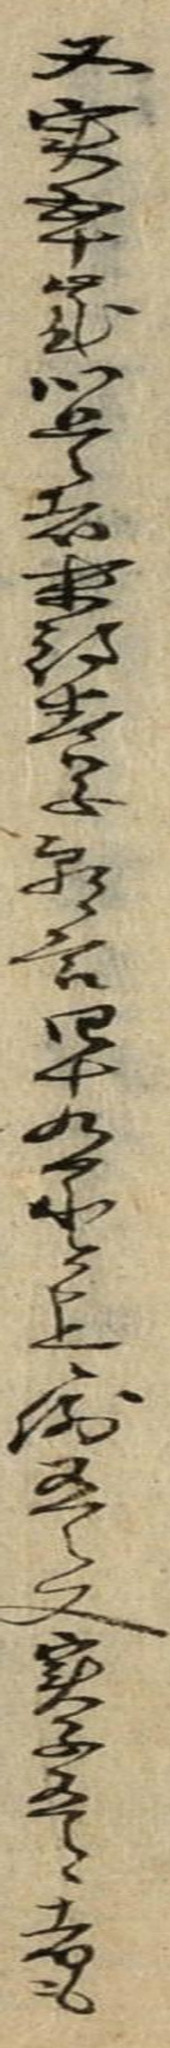又実五十歳以上之者末期養子願候節四十九歳と申上候例有之又実子有之候者も
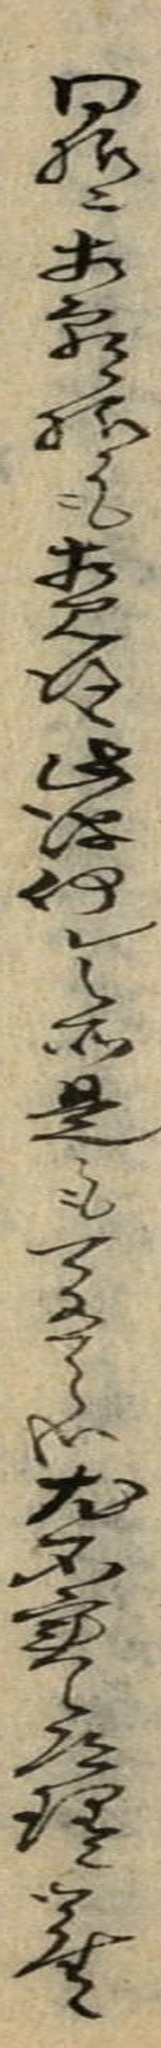同様ニ相願候様ニも相見得候比儀何レ之所是ニも可有之哉尤不実之道理ニ御座候
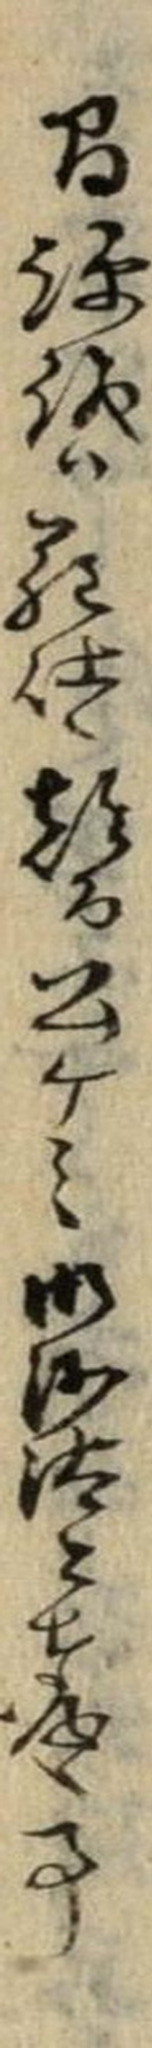間評儀ハ難仕候都而公ケ之御沙汰ニ奉存候事
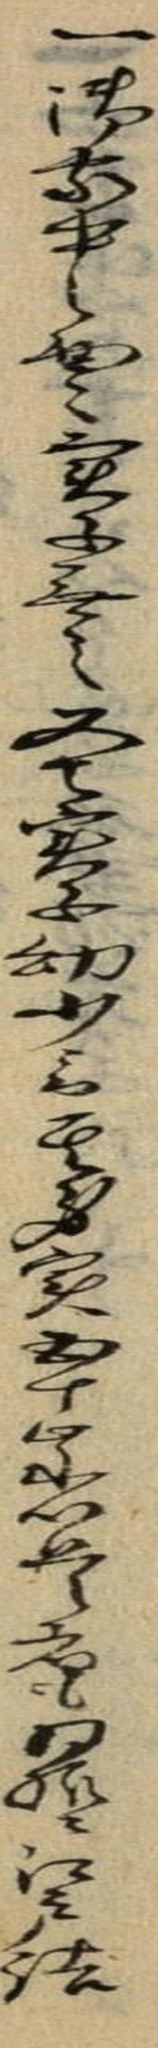一御家中之面々実子無之又者実子幼少ニ而其身実五十歳以上之者も同様ニ江戸詰
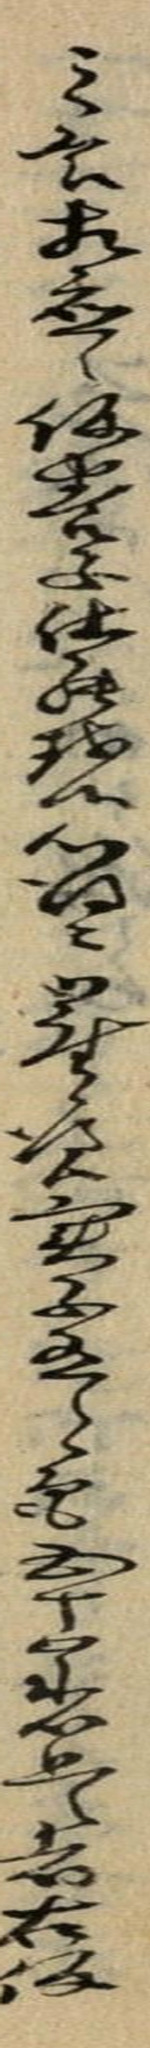之節相応之仮養子仕罷越候心得ニ御座候得ハ実子有之候而も五十歳以上之者右仮
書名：養子縁組之部
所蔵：福井県文書館 Fukui Prefectural Archives
